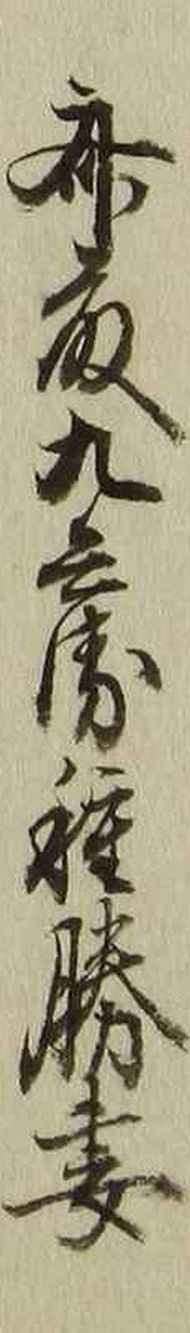女斉藤九兵衛種勝妻
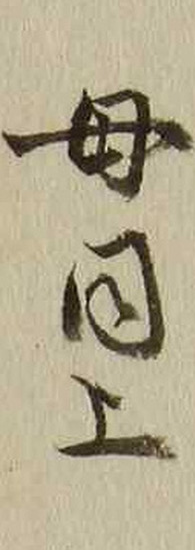母同上
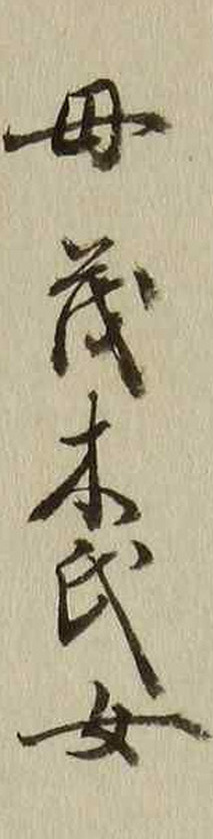母茂木氏女
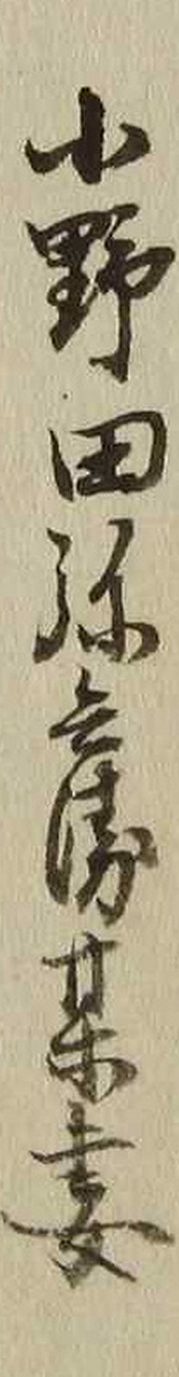女小野田弥兵衛某女
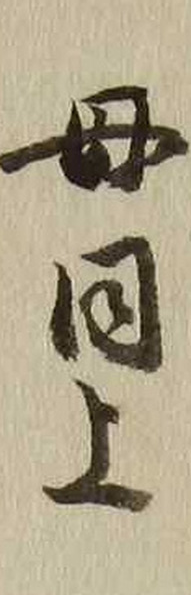母同上
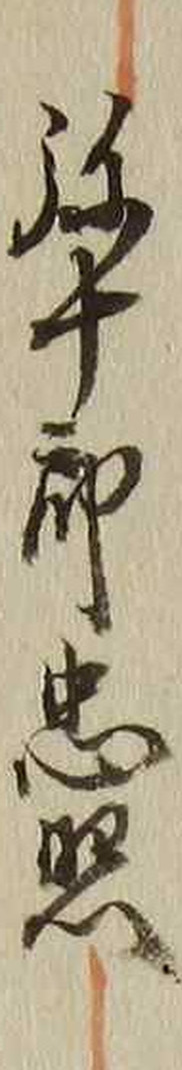弥十郎忠照
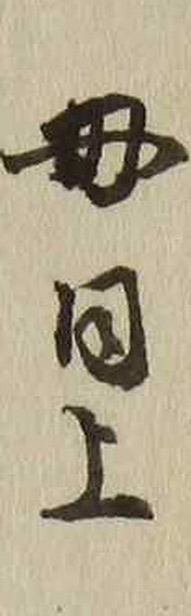母同上
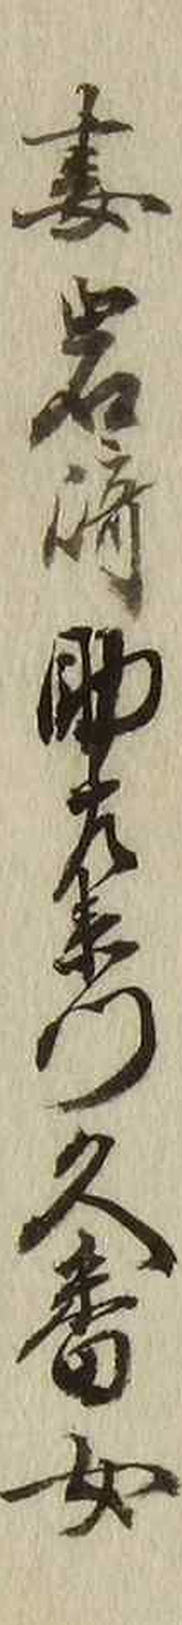妻岩崎助左衛門久番女
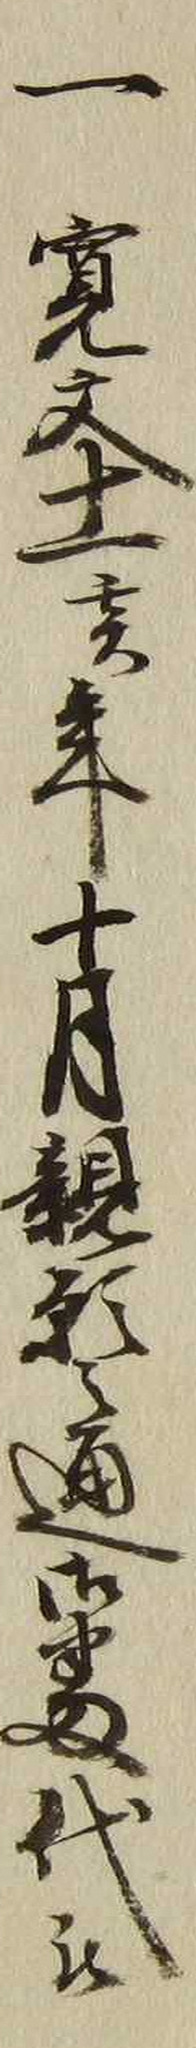一寛文十一亥年十月親願之通御番代被
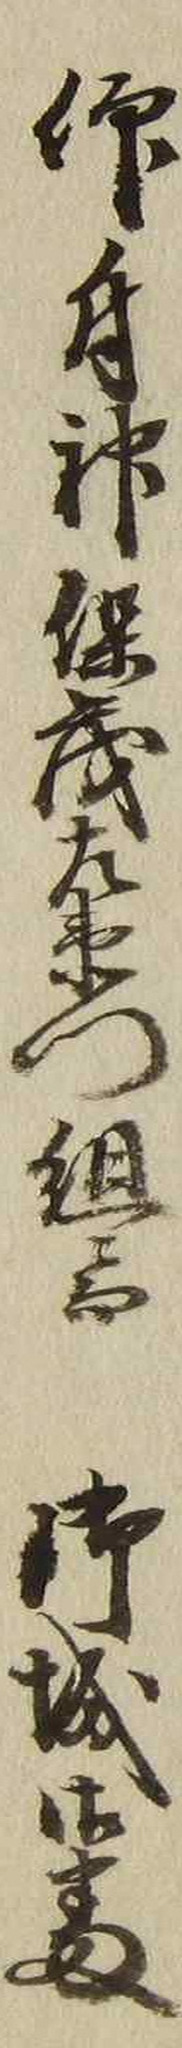仰付神保茂左衛門組ニ而御城御番
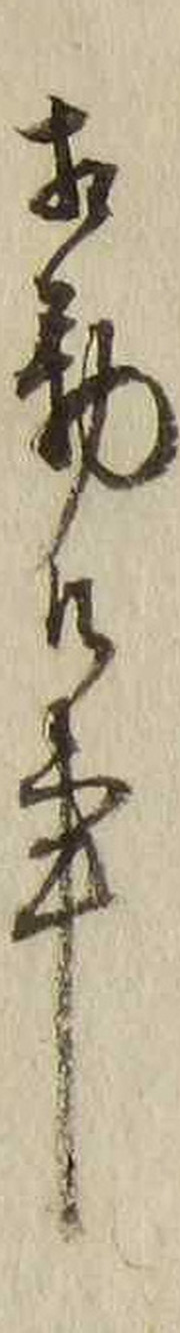相勤候事

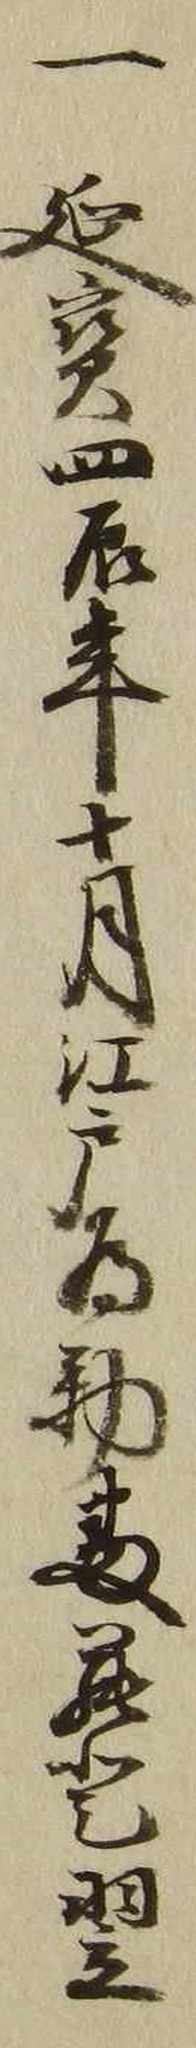一延宝四辰年十月江戸為勤番罷登翌
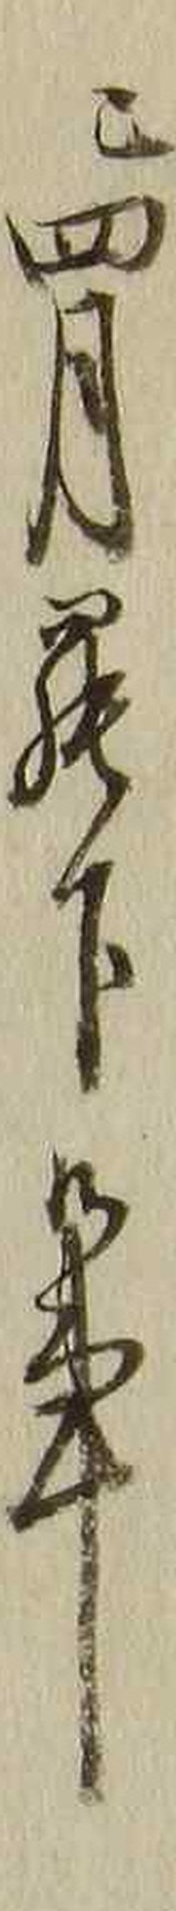巳四月罷下候事
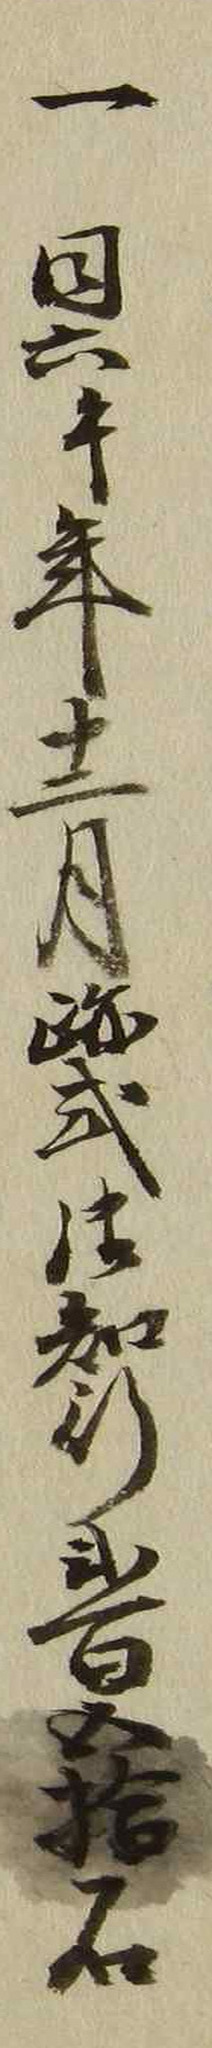一同六午年十二月跡式御知行二百五拾石
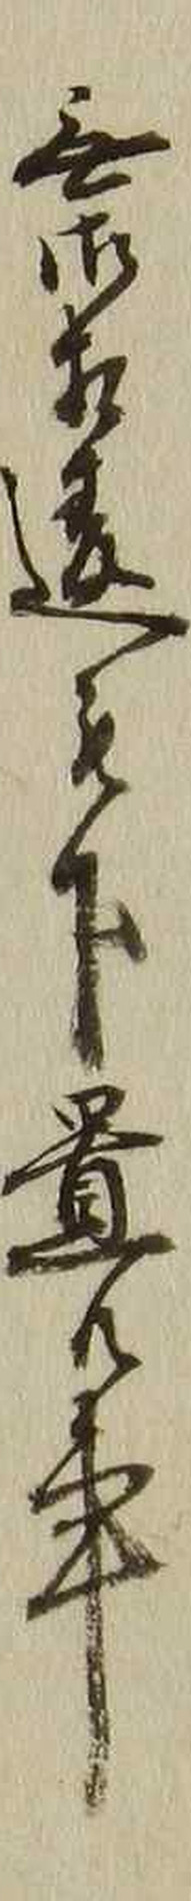無御相違被下置候事
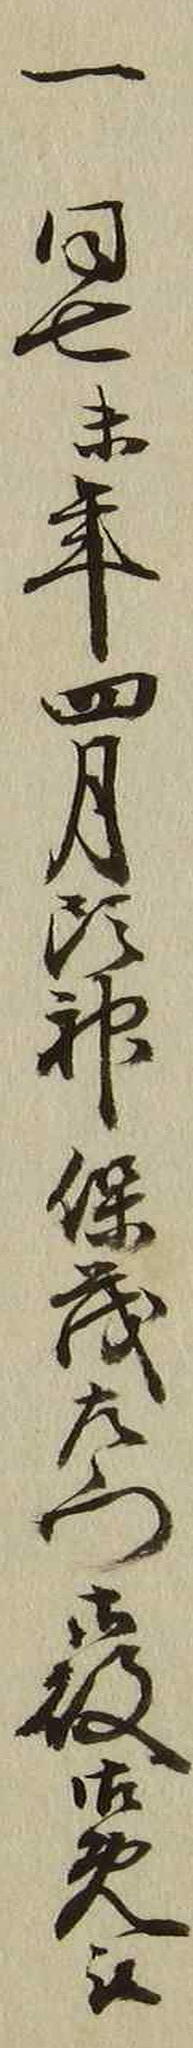一同七未年四月頭神保茂左衛門御役御免被
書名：諸士系譜　巻之64　と之部7
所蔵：会津若松市立会津図書館
